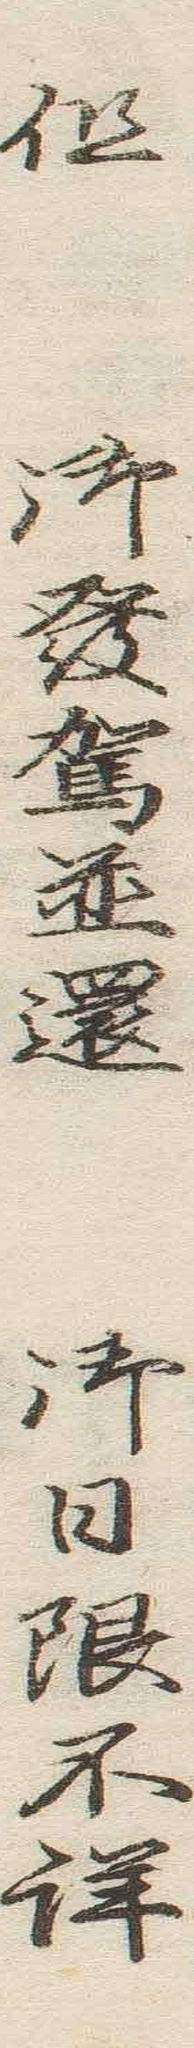但御發駕並還御日限不詳

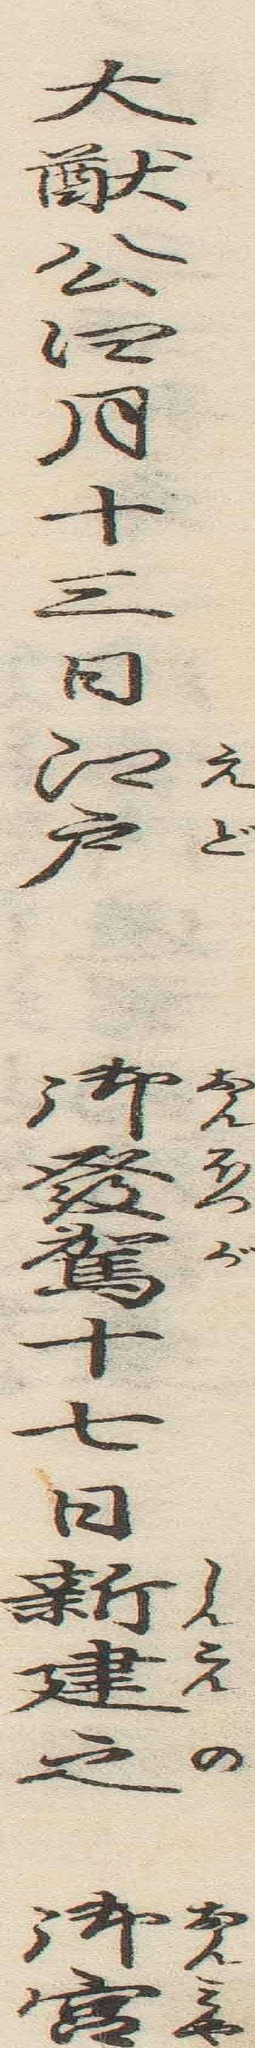大猷公四月十三日江戸御發駕十七日新建之御宮
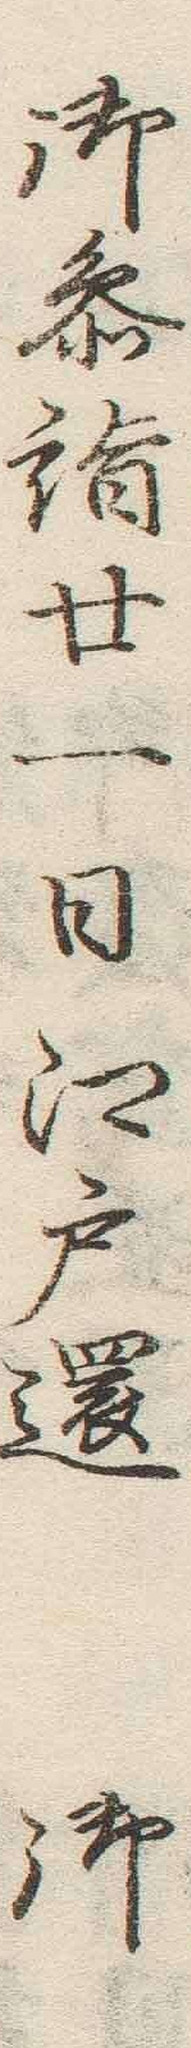御叅詣廿一日江戸還御
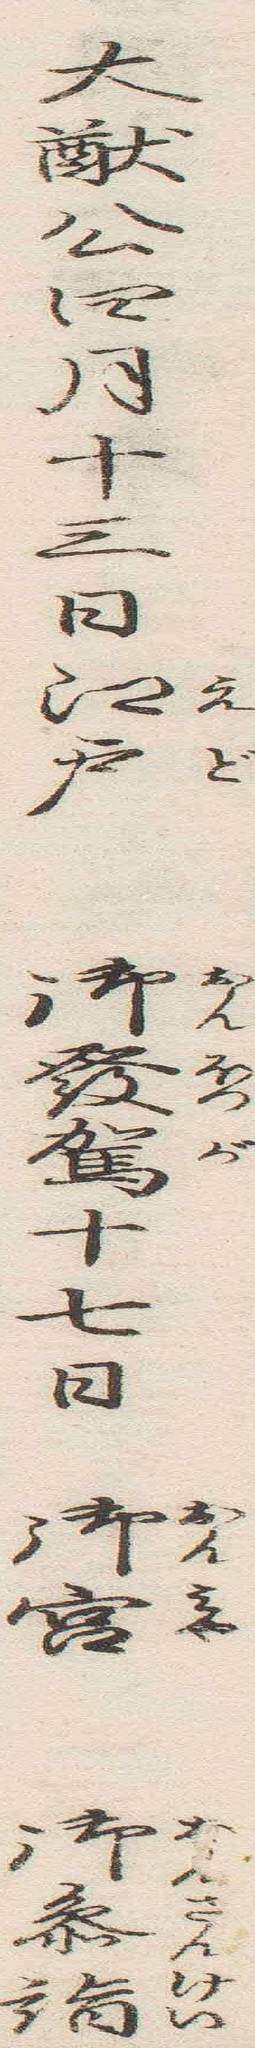大猷公四月十三日江戸御發駕十七日御宮御叅詣
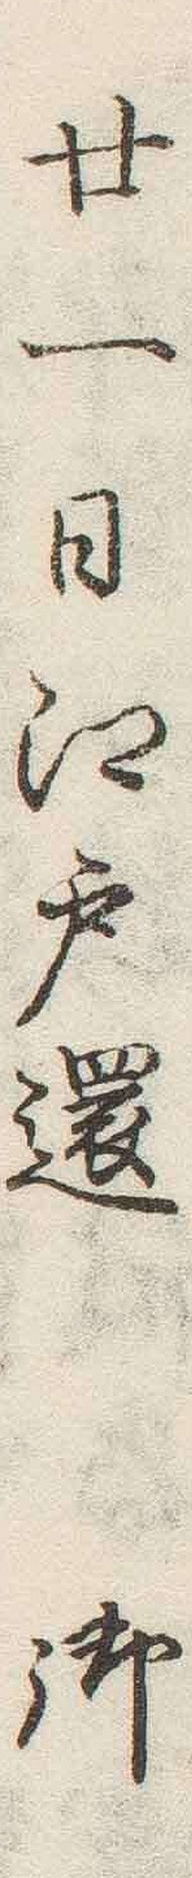廿一日江戸還御
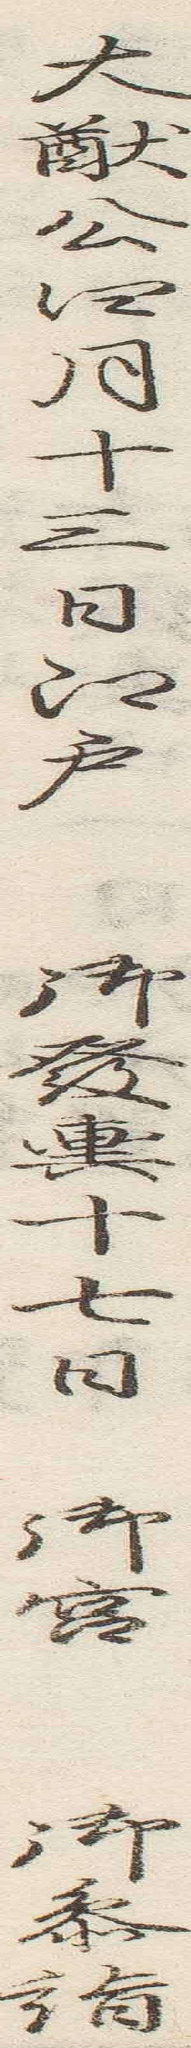大猷公四月十三日江戸御發輿十七日御宮御叅詣
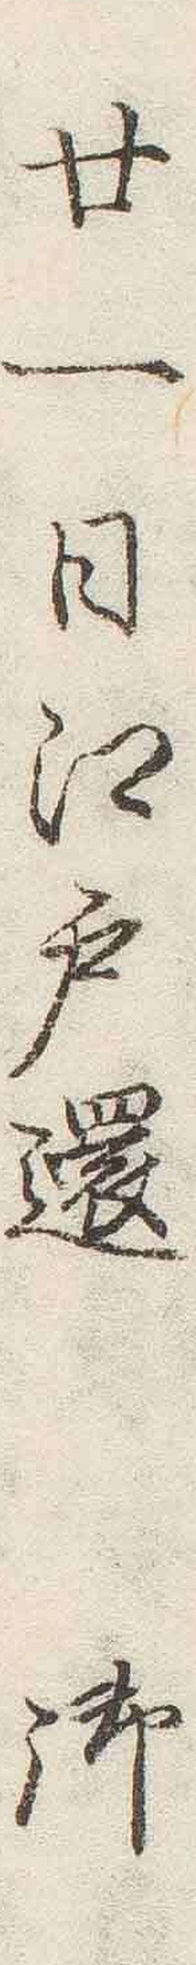廿一日江戸還御
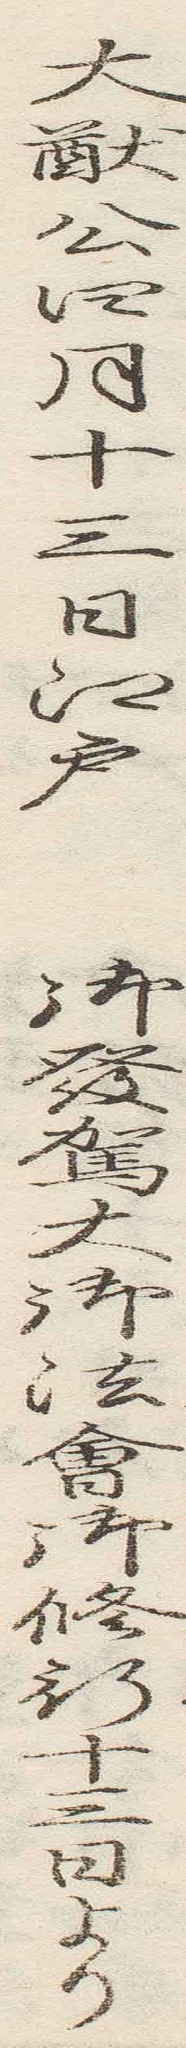大猷公四月十三日江戸御發駕大御法會御修行十三日より
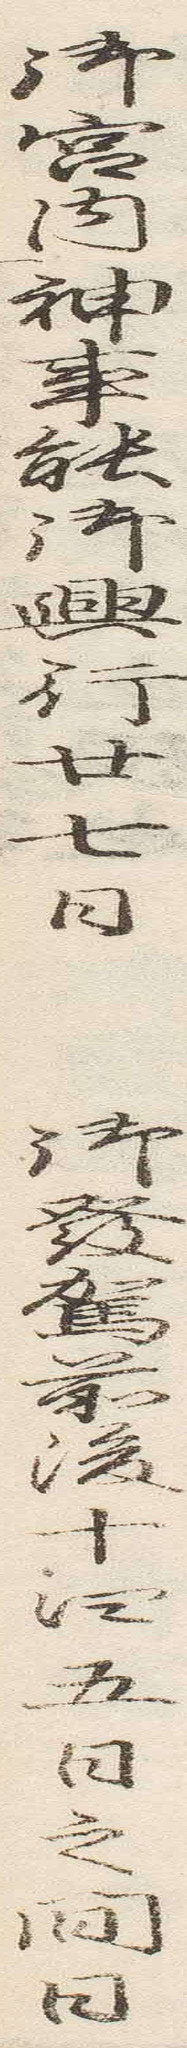御宮内神事能御興行廿七日御發駕前後十四五日之間日
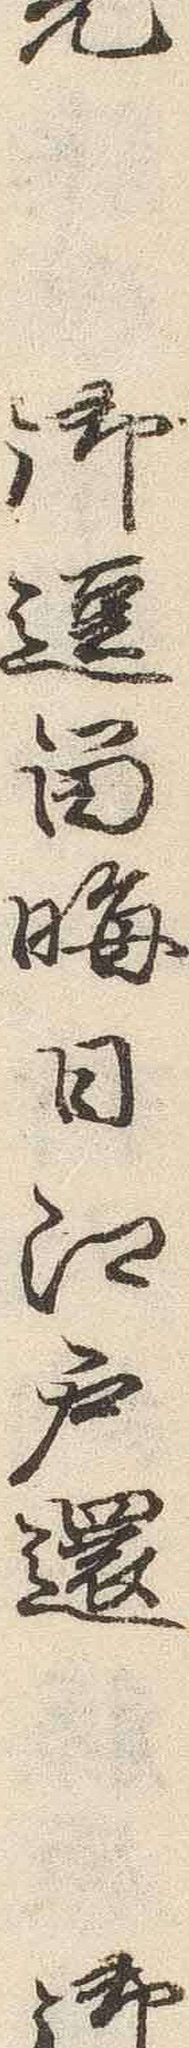光御逗畄晦日江戸還御
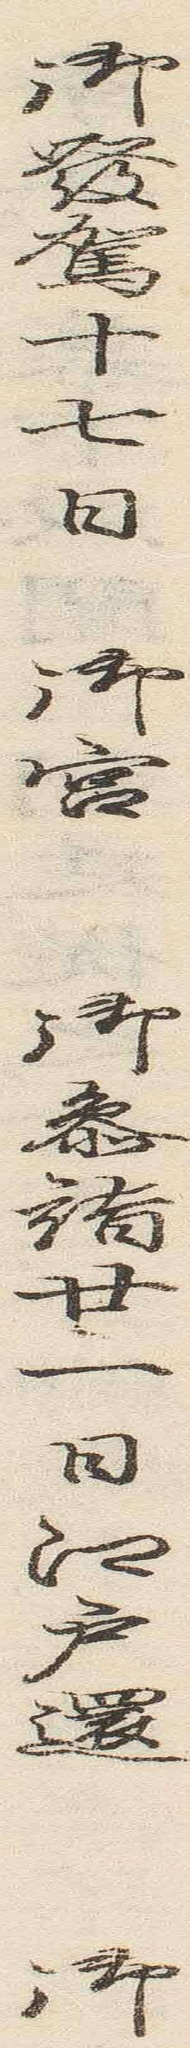御發駕十七日御宮御叅詣廿一日江戸還御
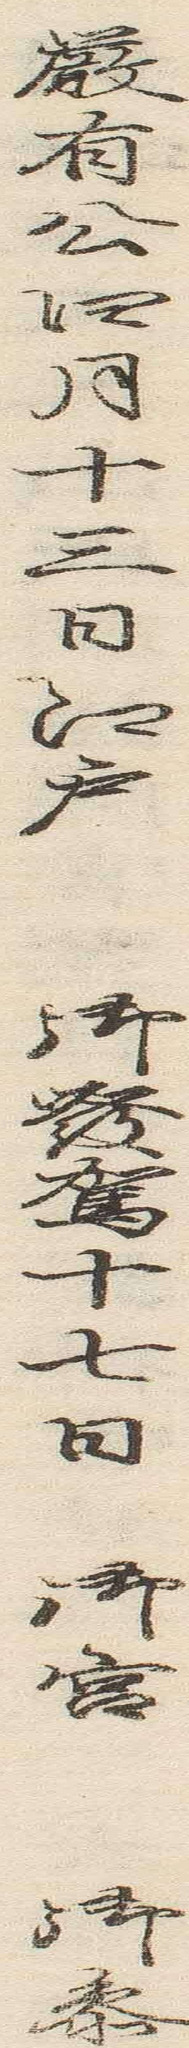厳有公四月十三日江戸御發駕十七日御宮御叅詣
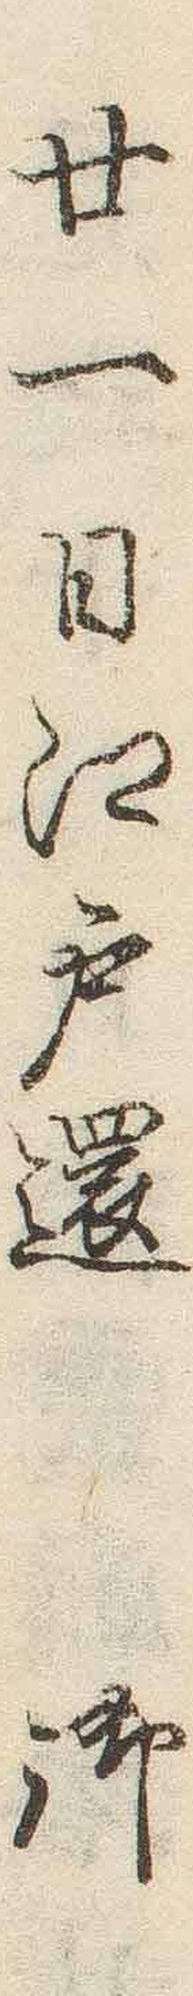廿一日江戸還御
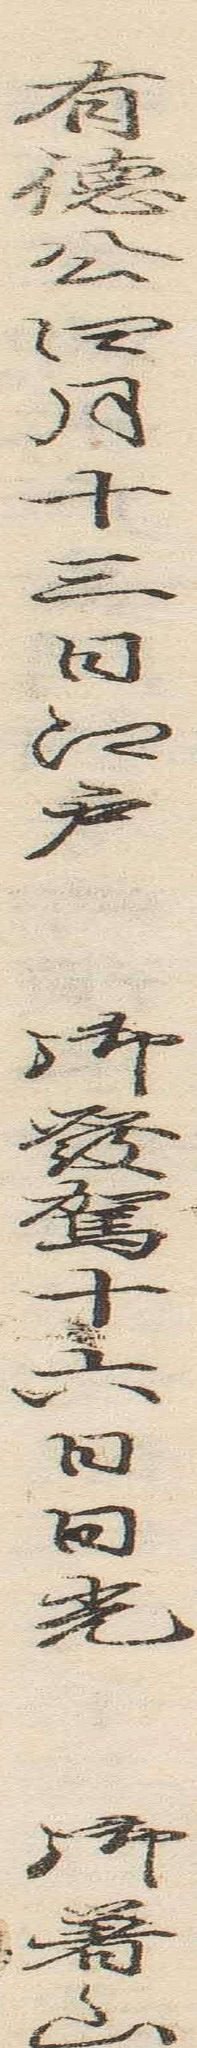有德公四月十三日江戸御發駕十六日日光御着山十
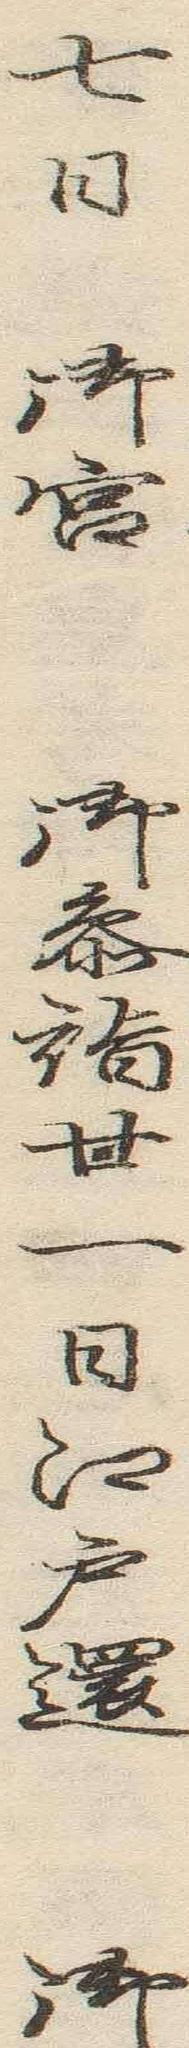七日御宮御叅詣廿一日江戸還御

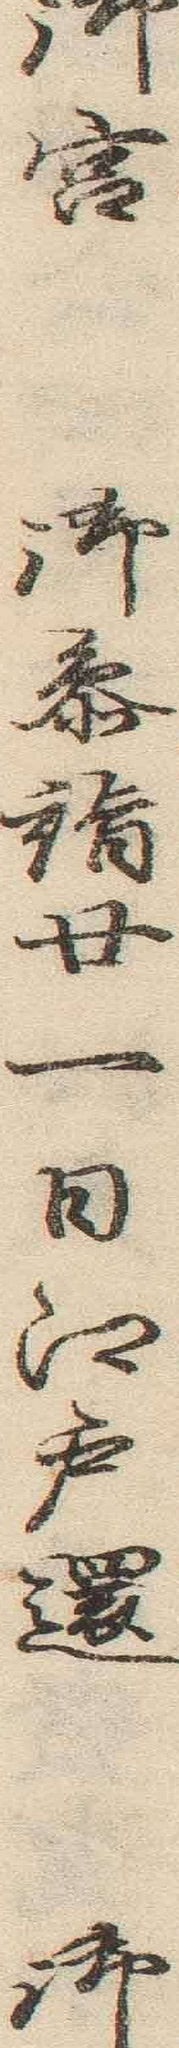御宮御叅詣廿一日江戸還御
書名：日光山志
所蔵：東京学芸大学附属図書館 国文学研究資料館
